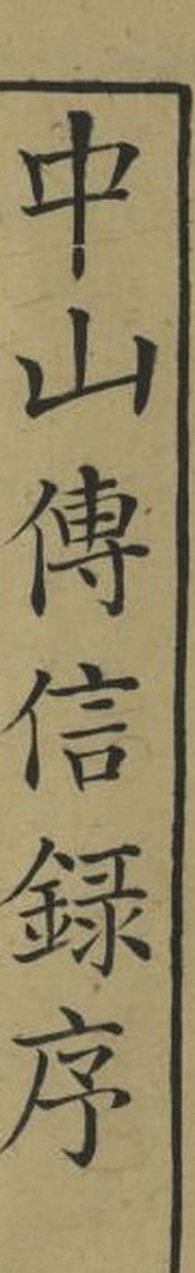中山傳信録序
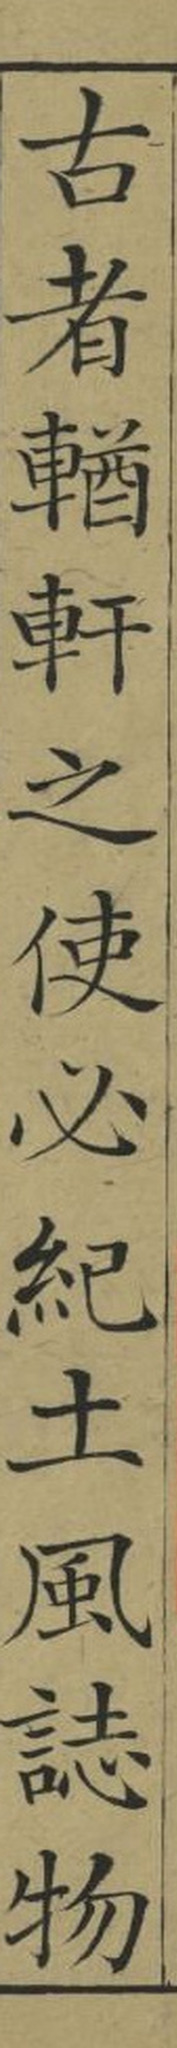古者輶軒之使必紀土風誌物
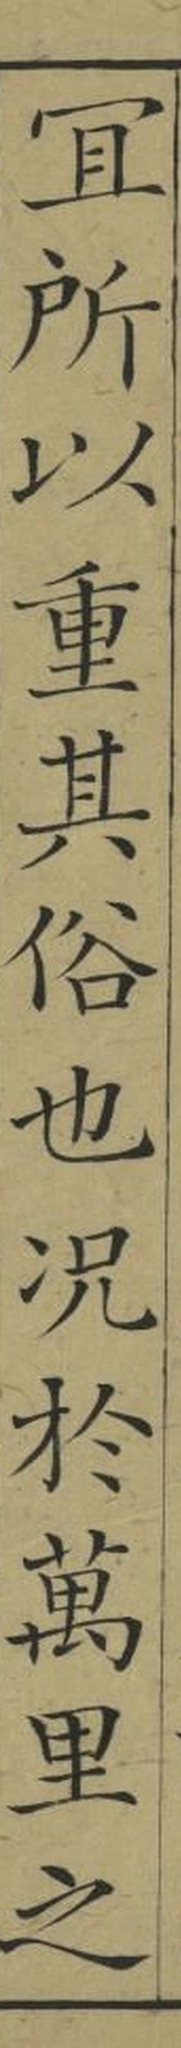冝所以重其俗也况扵萬里之
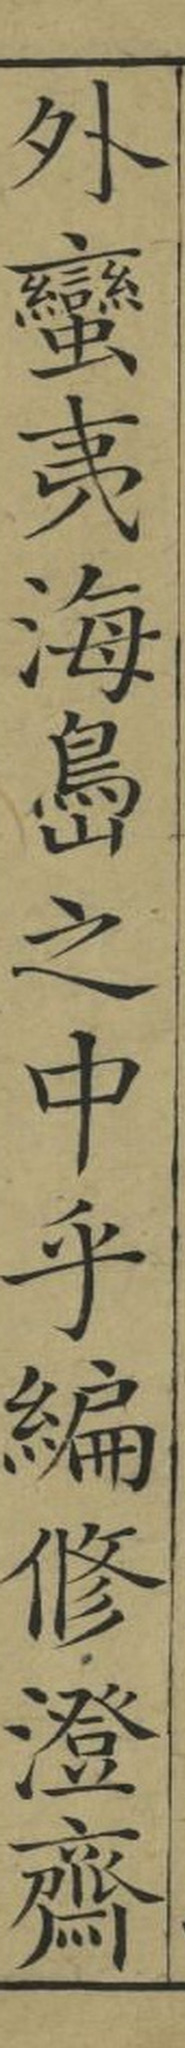外蠻夷海㠀之中乎編修澄齋
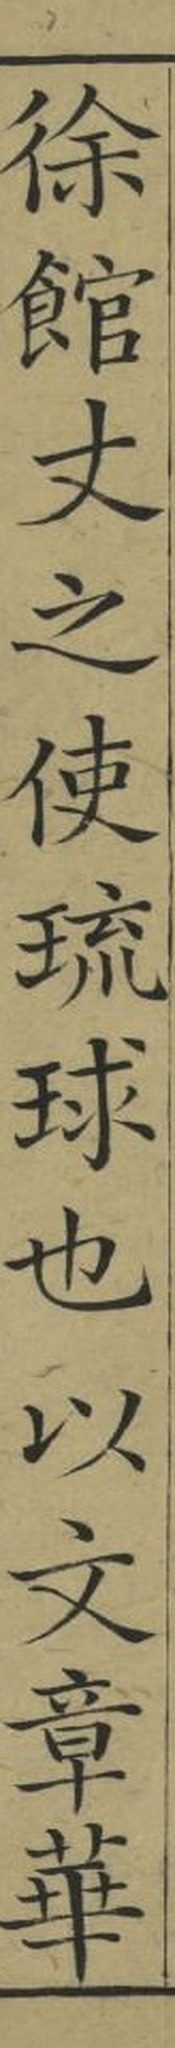徐館丈之使琉球也以文章華
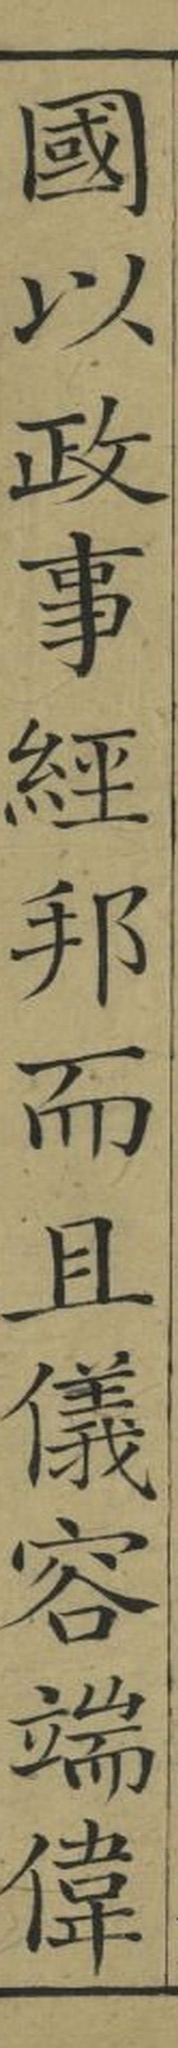國以政事經邦而且儀容端偉
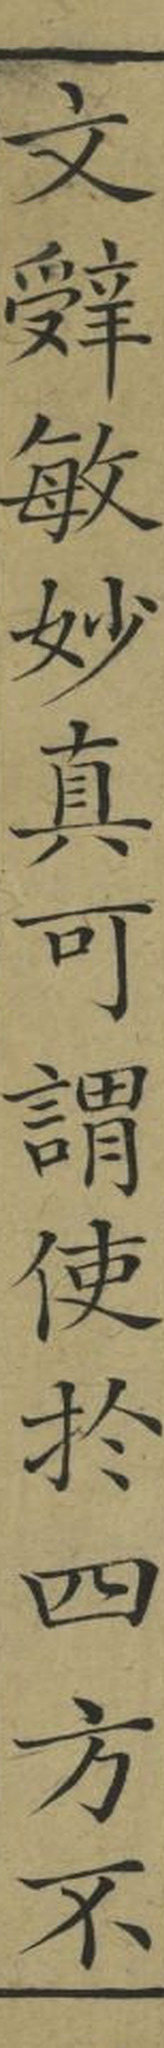文辤敏妙真可謂使扵四方不
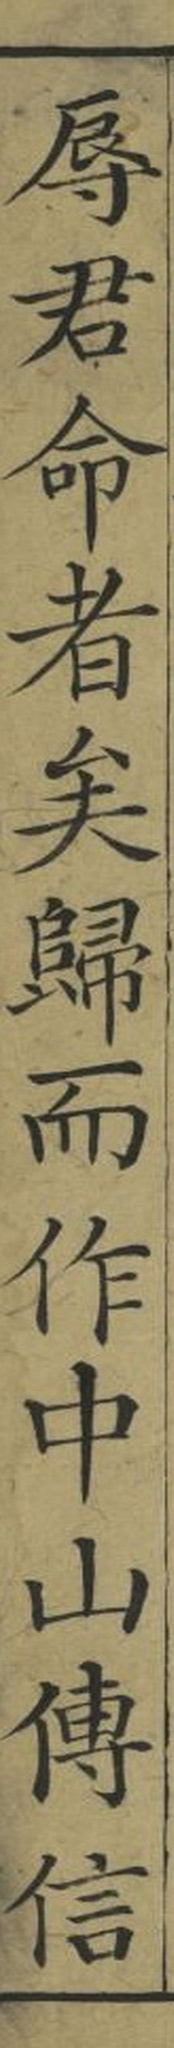辱君命者矣歸而作中山傳信

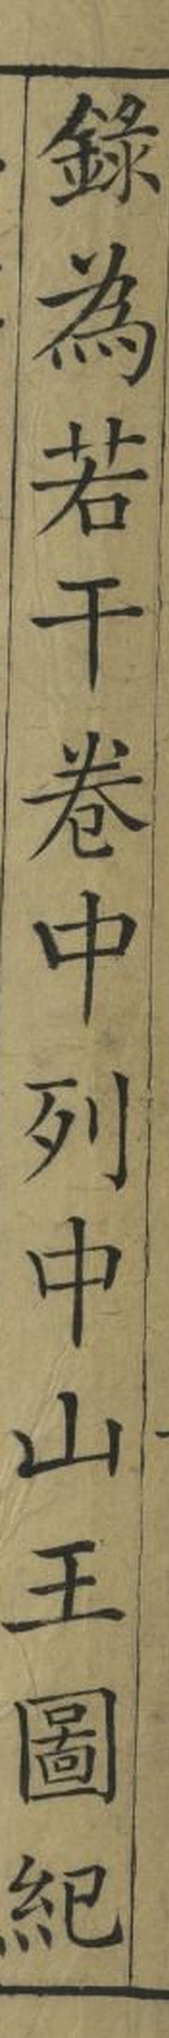錄為若干卷中列中山王圖紀
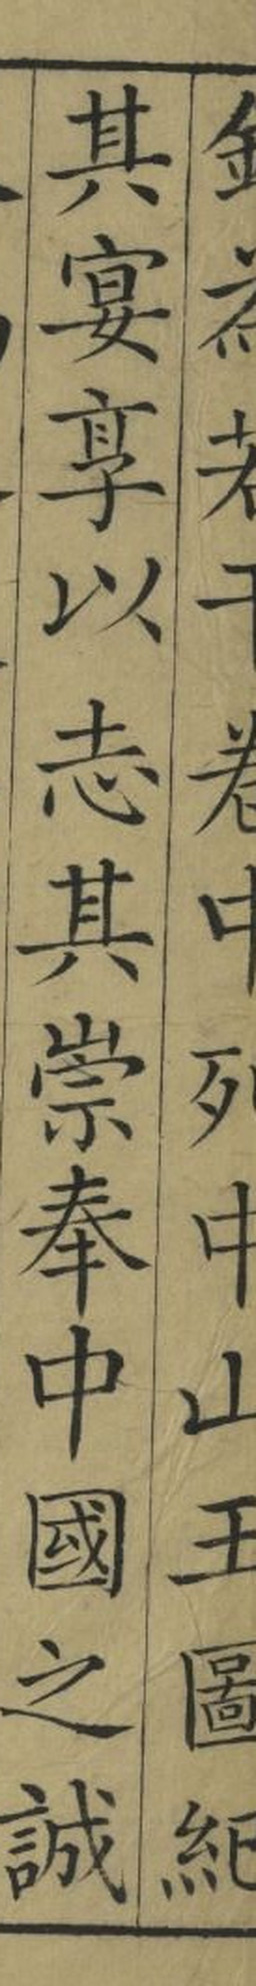其宴享以志其崇奉中國之誠
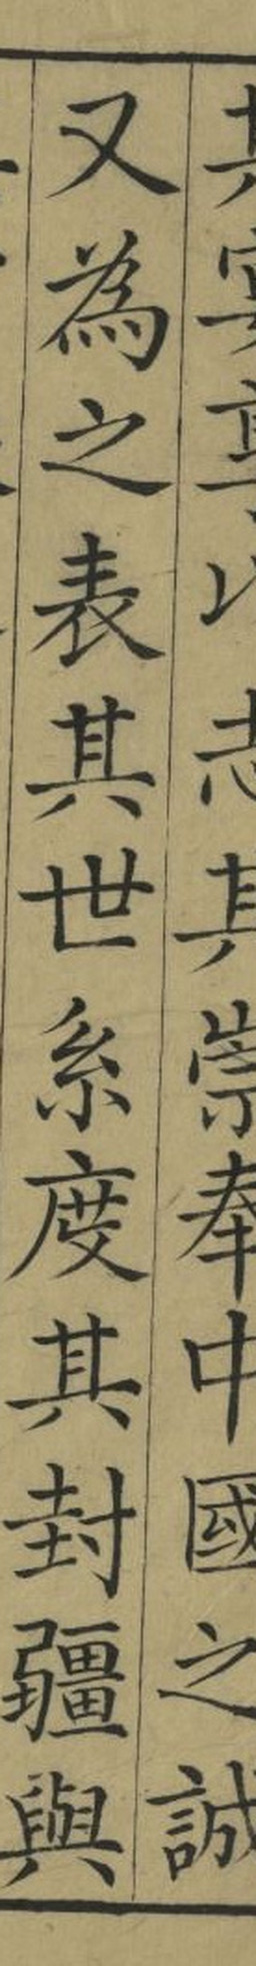又為之表其世系度其封疆與
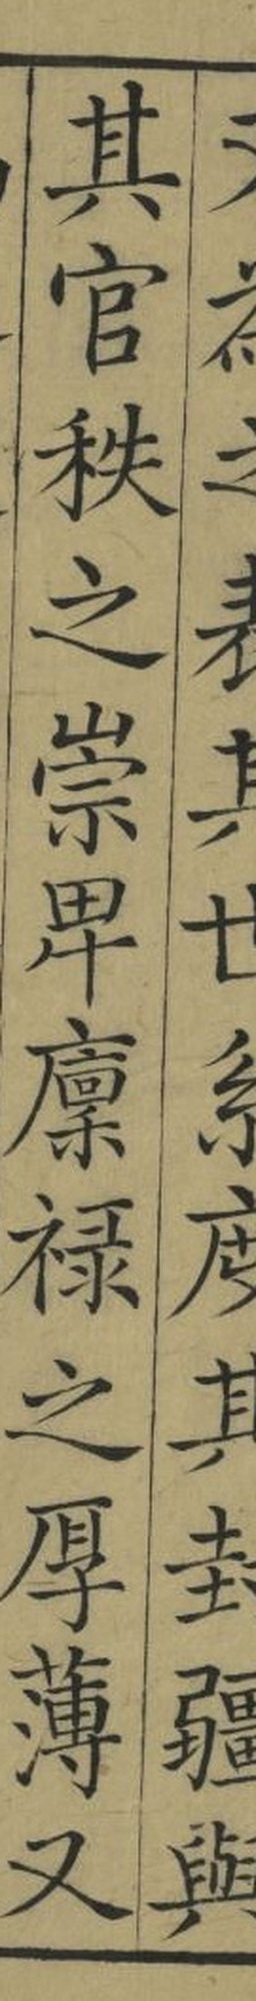其官秩之崇卑廩禄之厚薄又
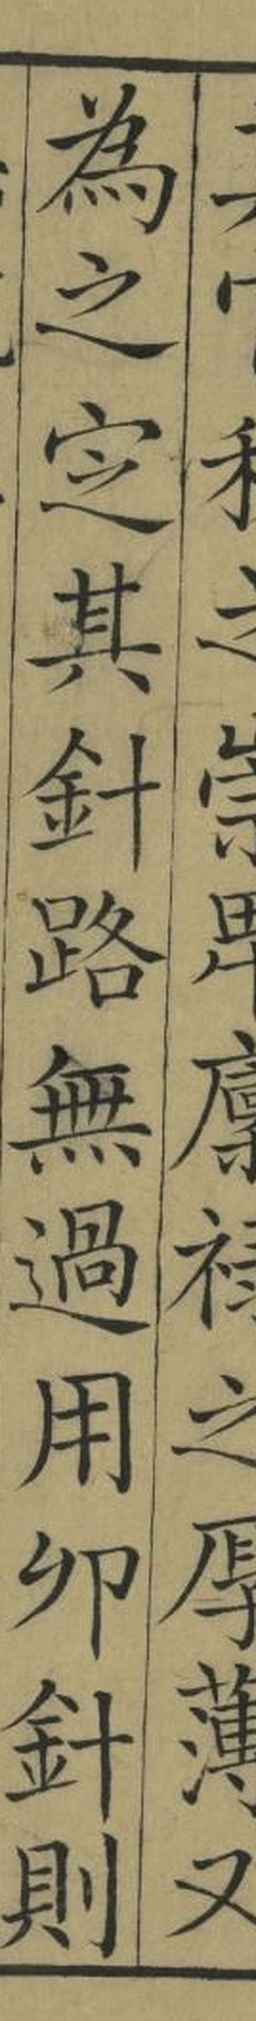為之㝎其針路無過用叩針則
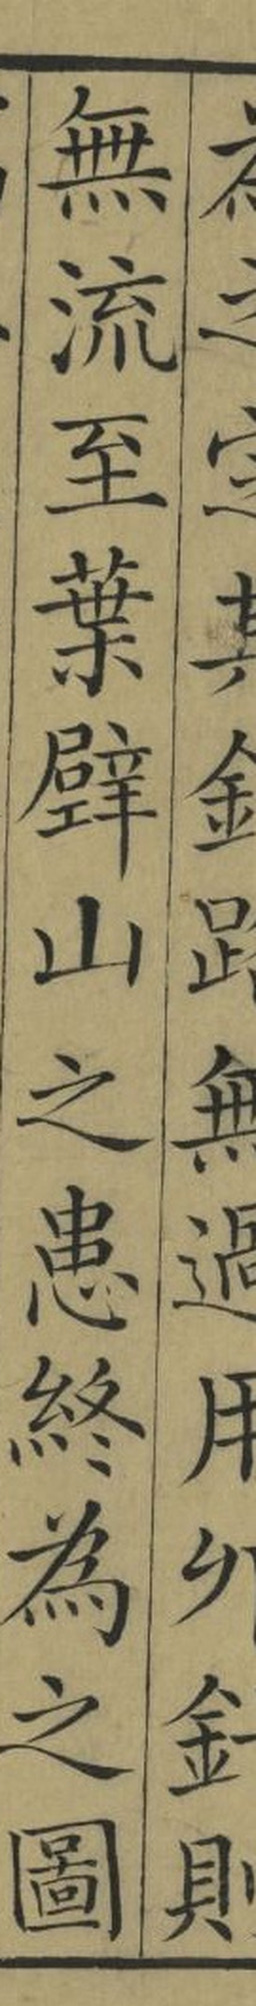無流至葉壁山之患終為之圖
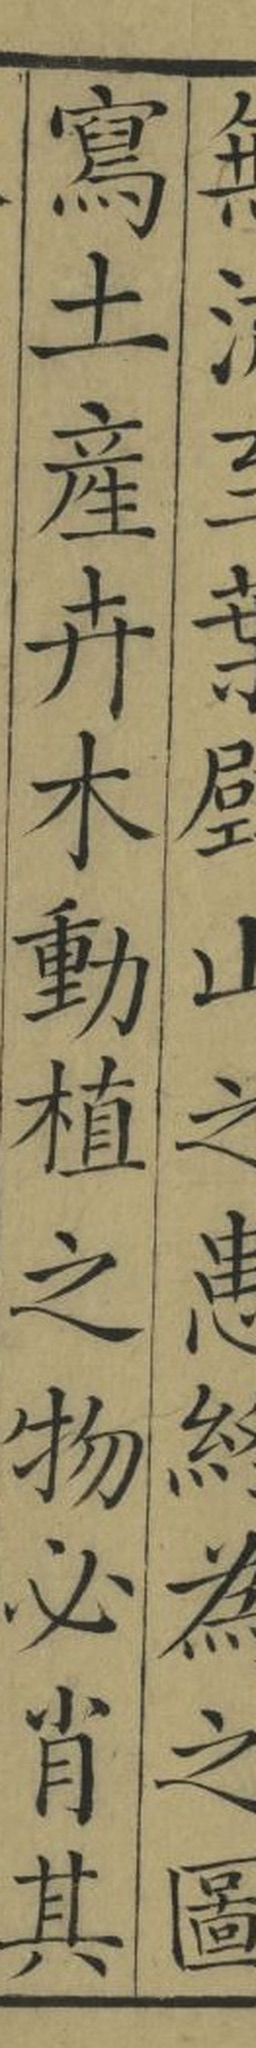寫土産卉木動植之物必肖其
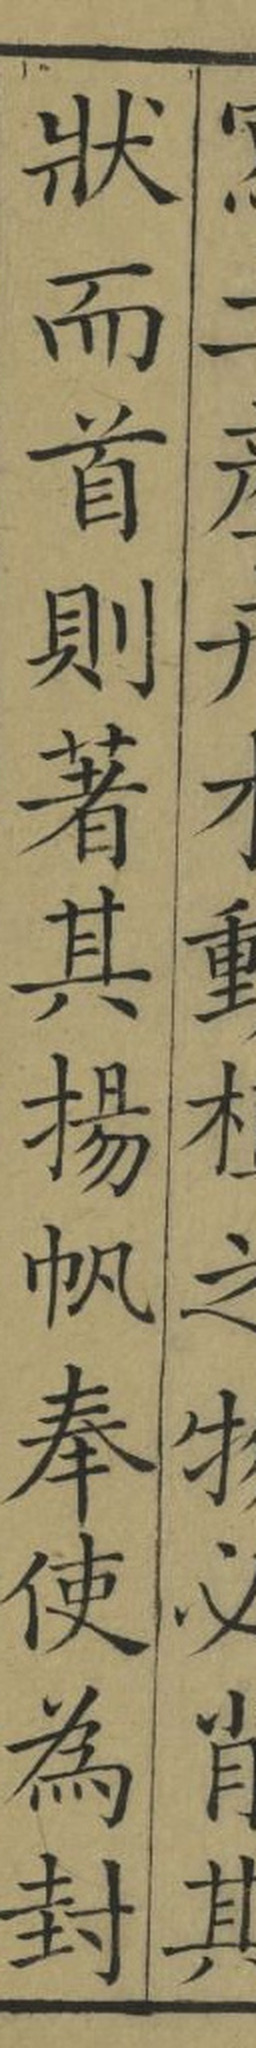狀而首則著其揚帆奉使為封
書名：中山伝信録 巻一
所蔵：University of the Ryukyus Library
